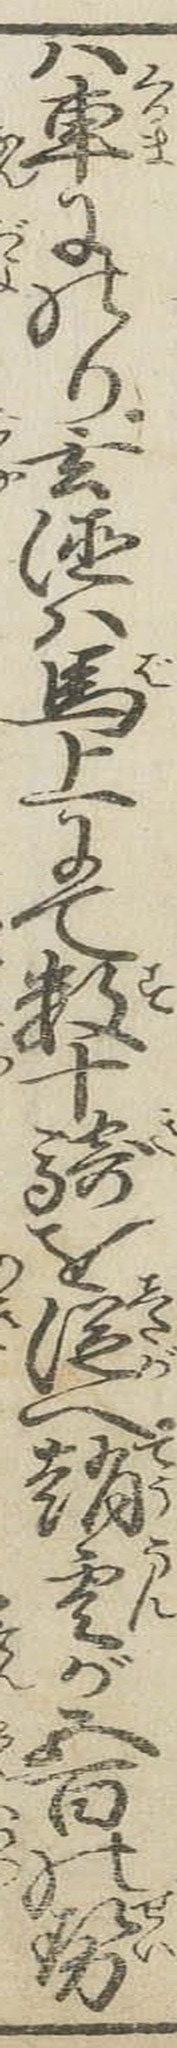は車にのり。玄徳は馬上にて数十騎を従へ。趙雲が五百の勢
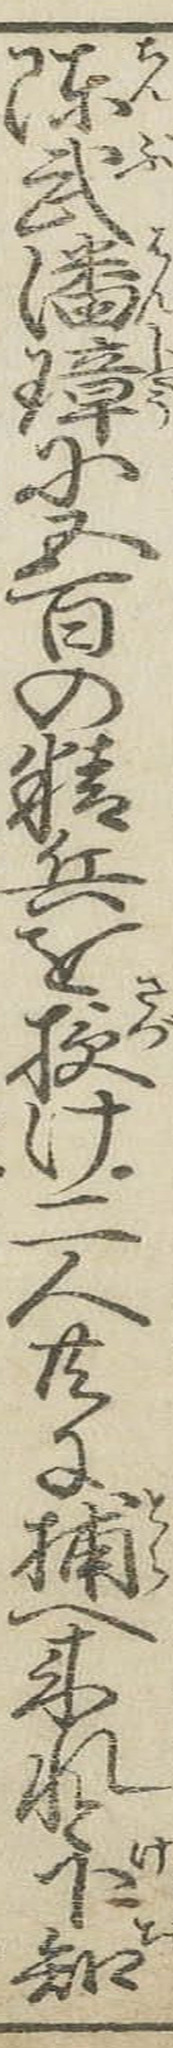陳武潘璋に五百の精兵を授け。二人共に捕へ来れと下知
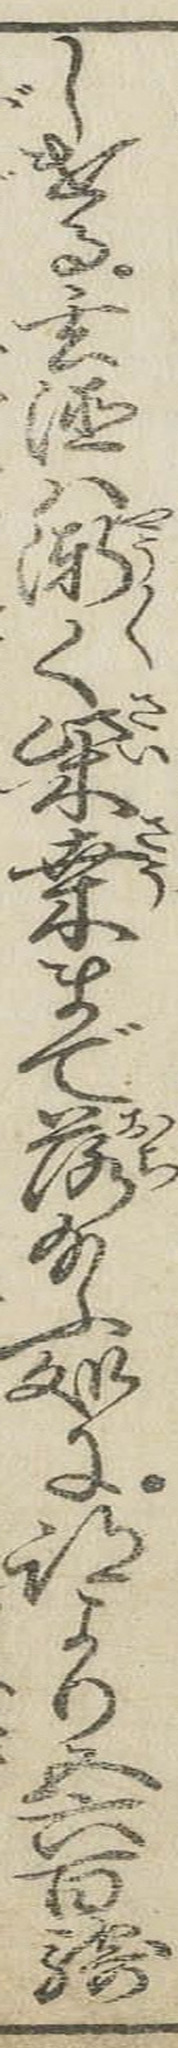しける。玄徳は漸〳〵柴桑まで落給ふ処に。跡より五六百騎
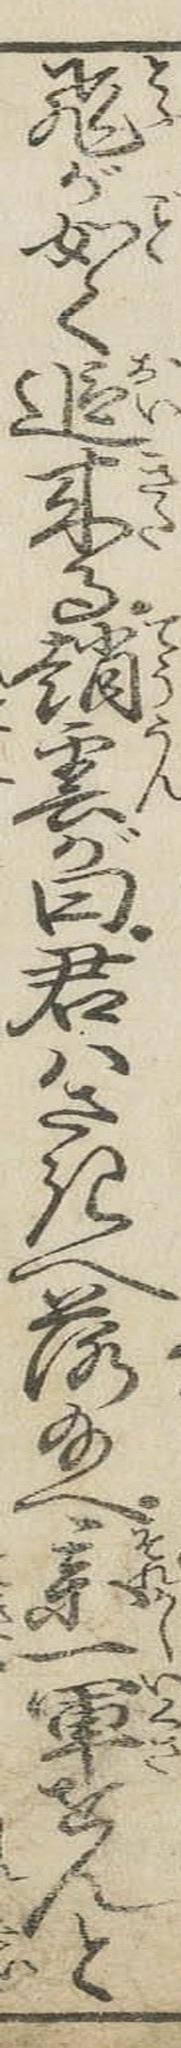飛が如く追来る。趙雲が曰。君はさきへ落給へ。某一軍せんと
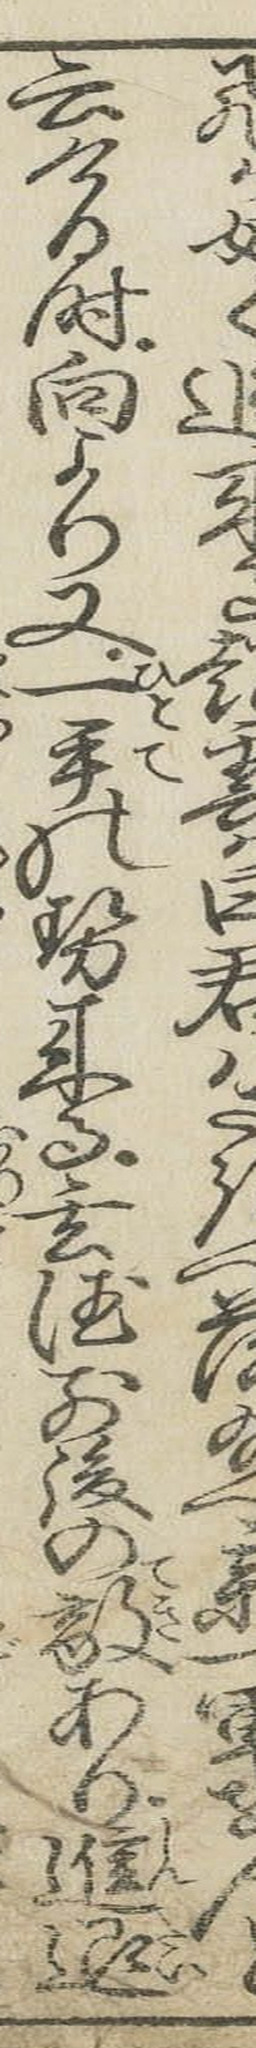云ける時。向より又。一手の勢来る。玄徳前後の敵あり。進退
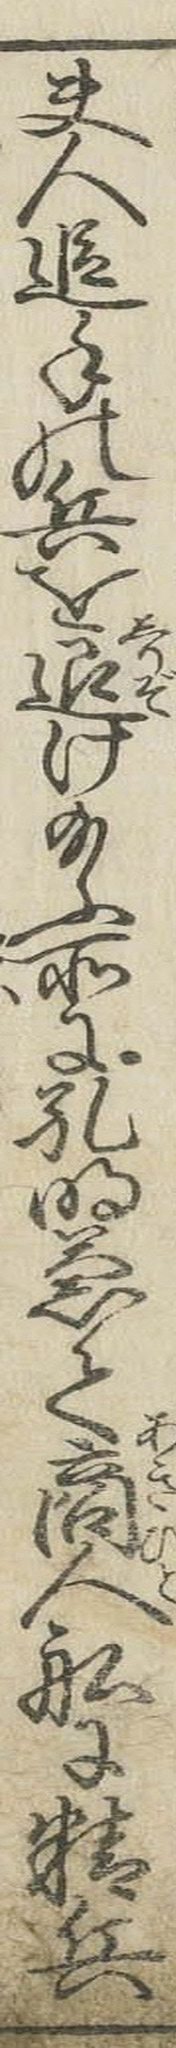夫人追手の兵を退け給ふ所に。孔明兼て商人船に精兵
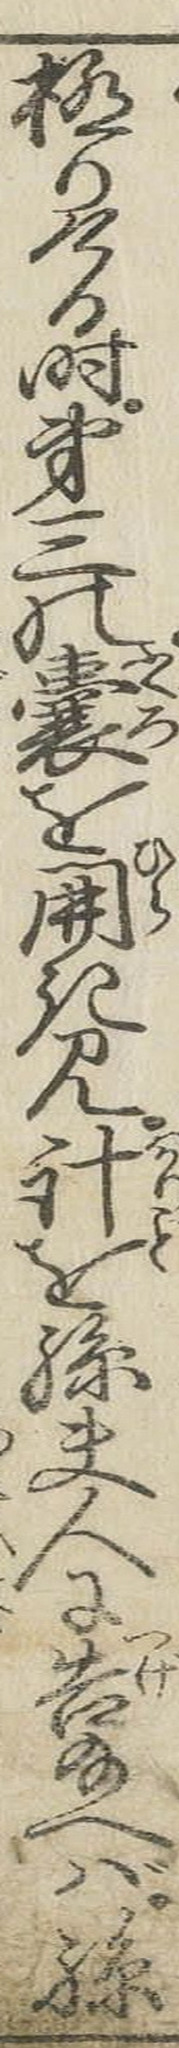極りける時。第三の嚢を開き見。計を孫夫人に告給へば。孫
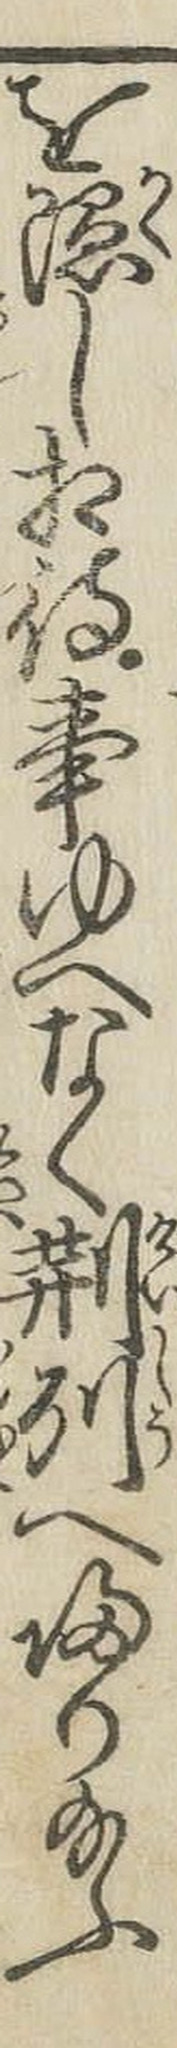を隠し相待。事ゆへなく荊州へ帰り給ふ
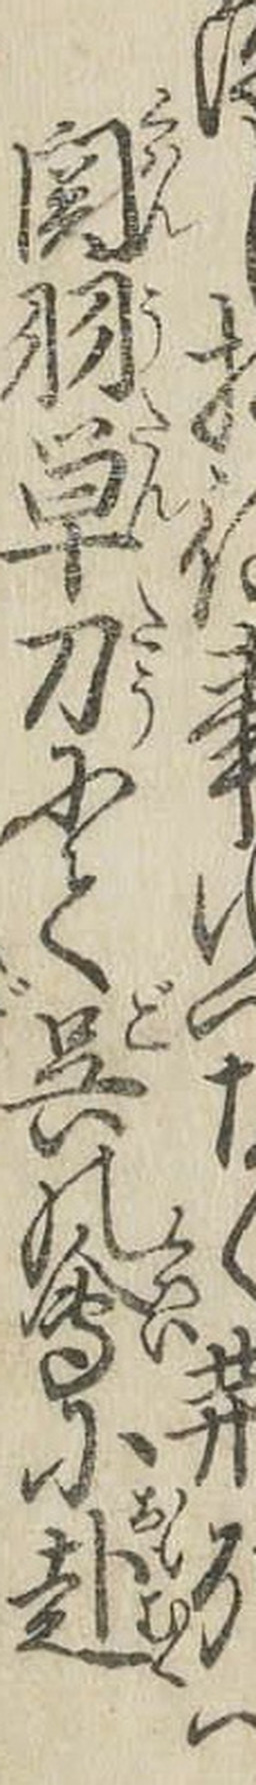関羽単刀にて呉の会に赴
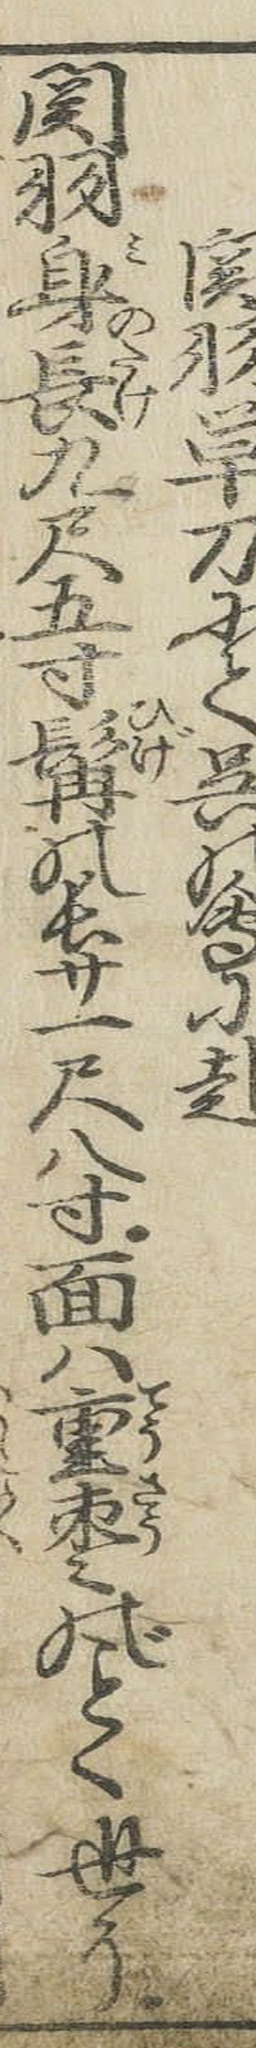関羽身長九尺五寸髯の長サ一尺八寸。面は重棗のごとく世に。
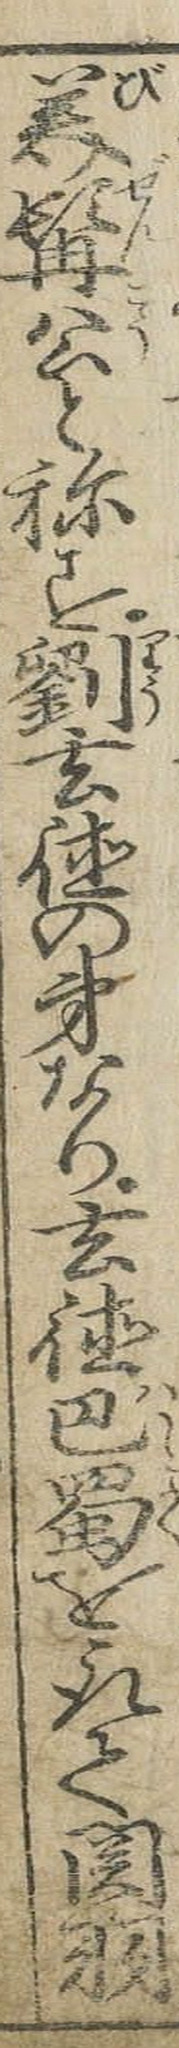美髯公と称す。劉玄徳の弟なり。玄徳巴蜀を取て関羽

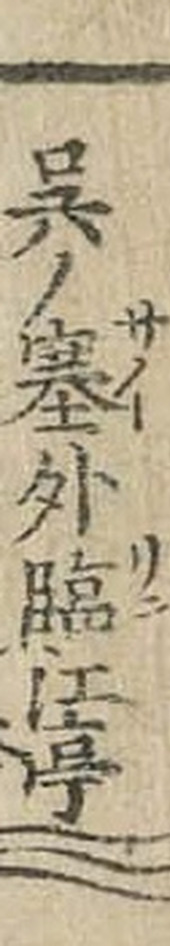呉ノ塞外臨江亭
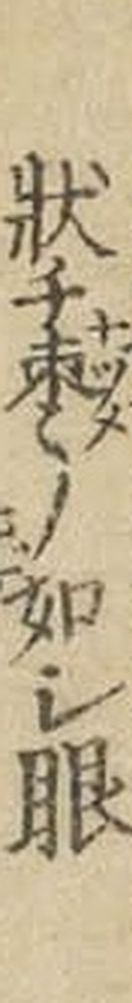状チ棗ノ如シ眼金紋
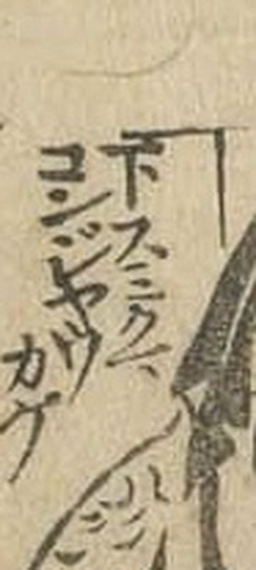コンジヤウ
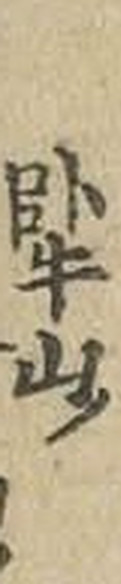臥牛山ノ

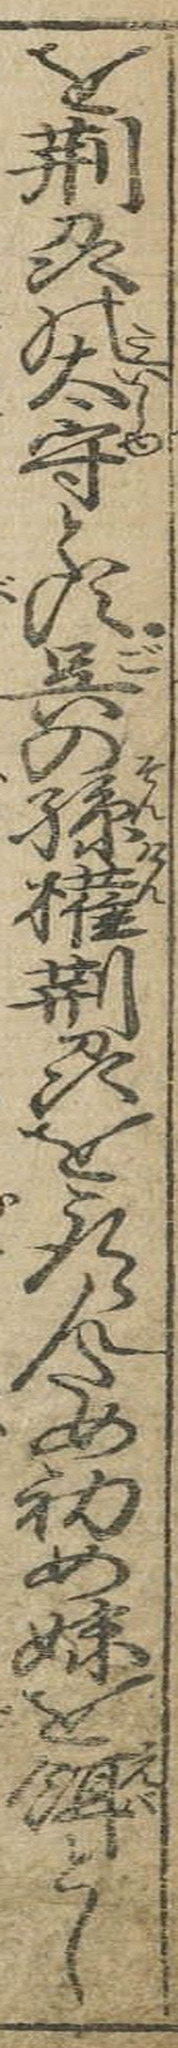を荊州の太守とす。呉の孫権荊州を取らんため初め妹を餌とし
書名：絵本写宝袋 9巻 7之巻
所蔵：東京学芸大学教育コンテンツアーカイブ
